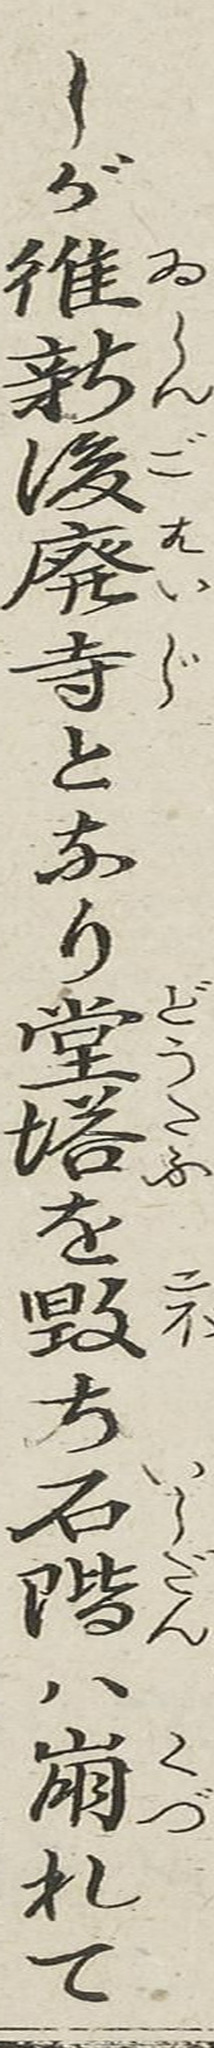しが維新後廃寺となり堂塔を毀ち石階は崩れて
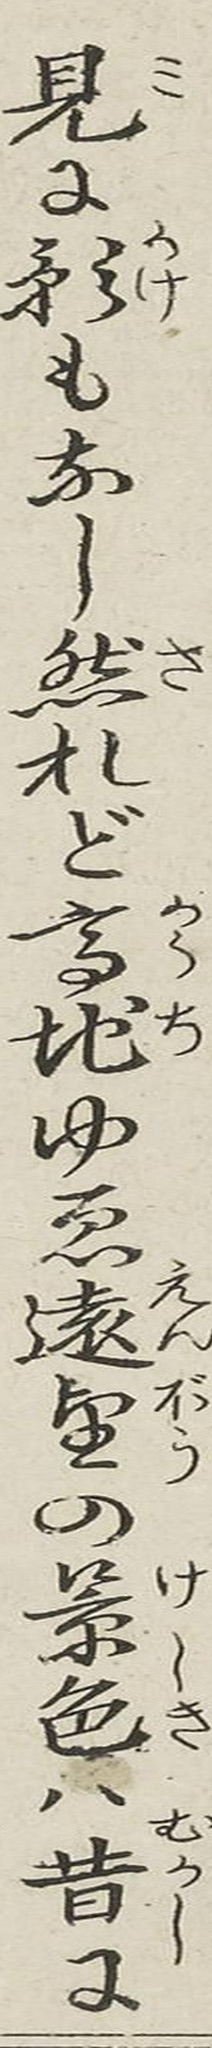見る影もなし然れど高地ゆゑ遠望の景色は昔に
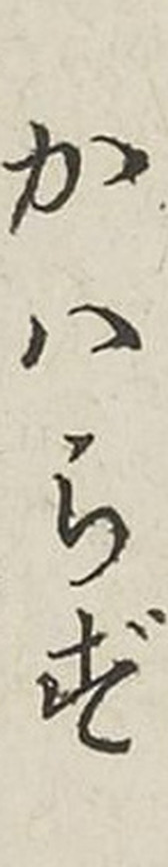かはらず
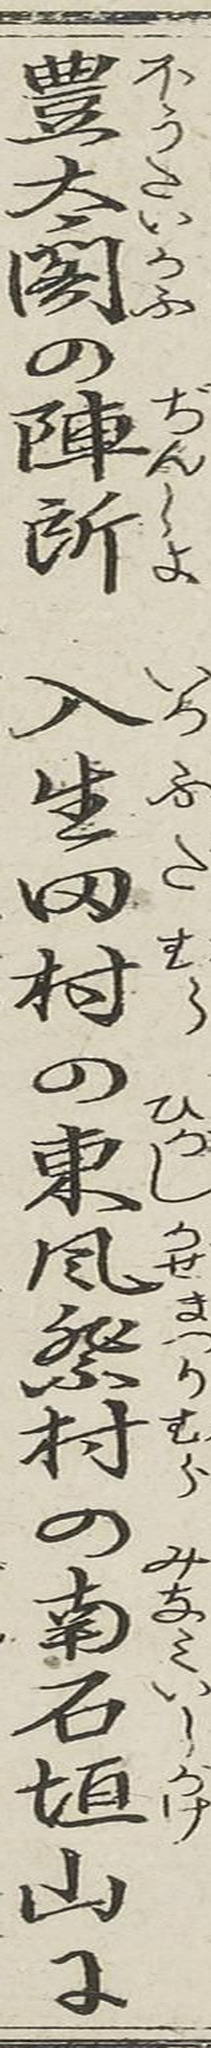豊太閤の陣所入生田村の東風祭村の南石垣山に
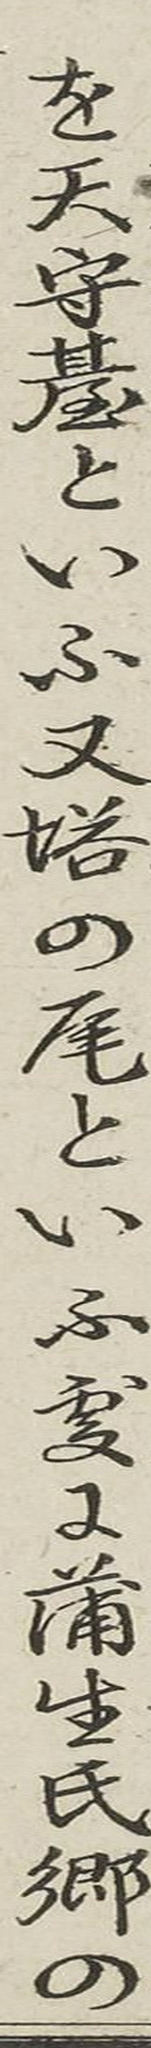を天守台といふ又塔の尾といふ処に蒲生氏郷の
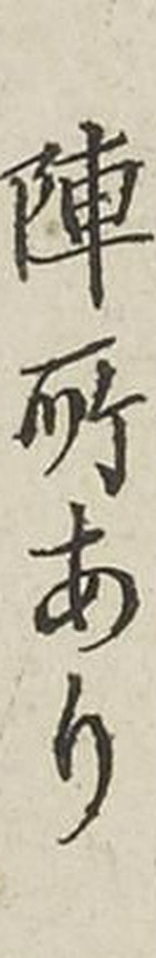陣所あり

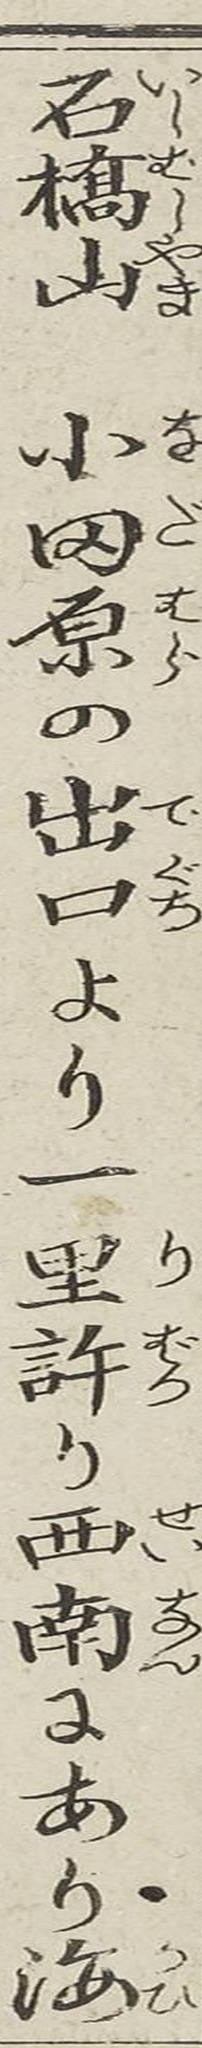石橋山小田原の出口より一里許り西南にあり海
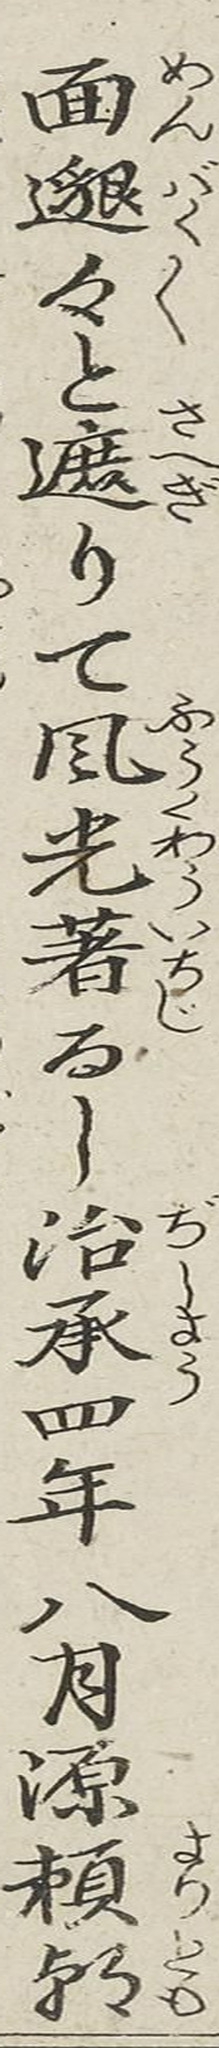面邈々と遮り風光著るし治承四年八月源頼朝
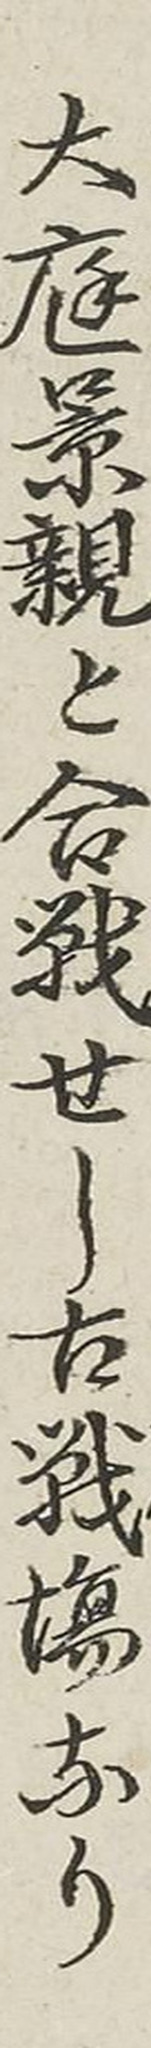大庭景親と合戦せし古戦場なり
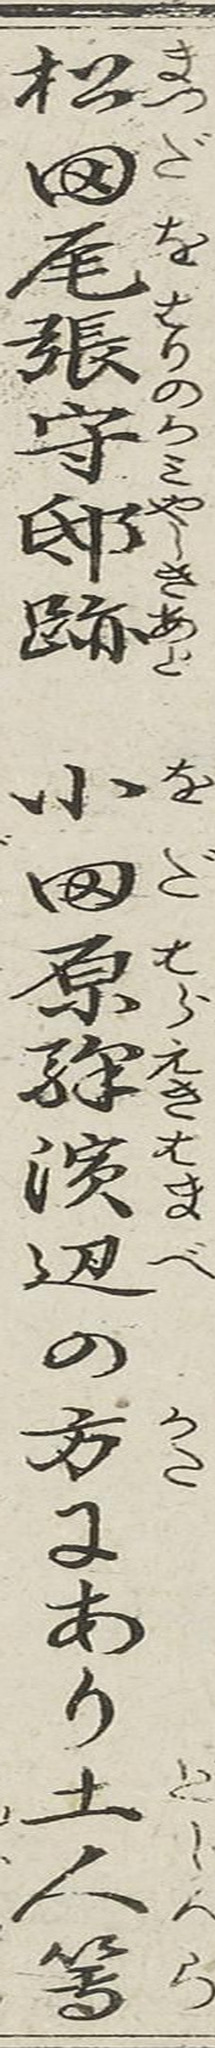松田尾張守邸跡小田原駅浜辺の方にあり土人等
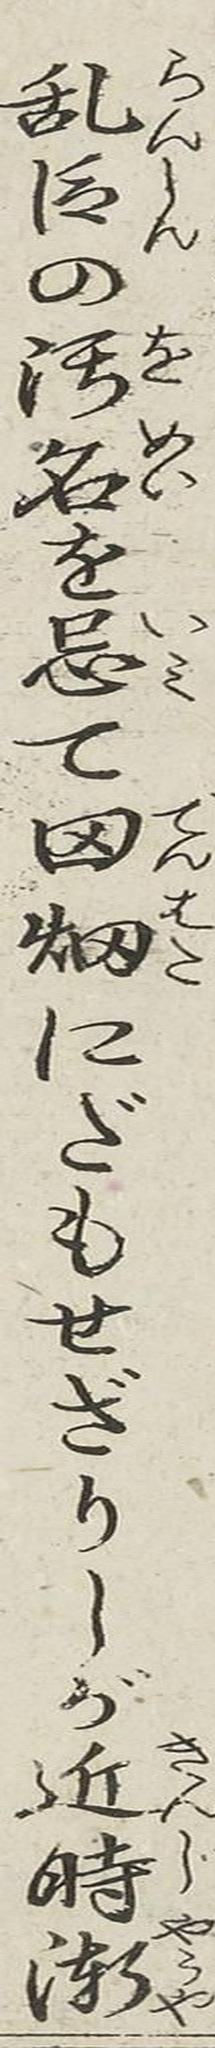乱臣の汚名を忌て田畑にだもせざりしが近時漸
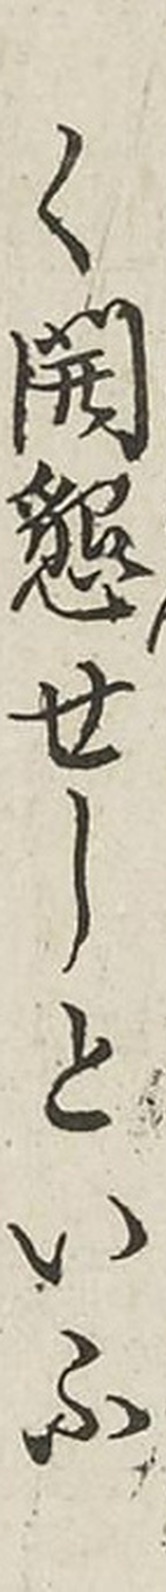く開墾せしといふ
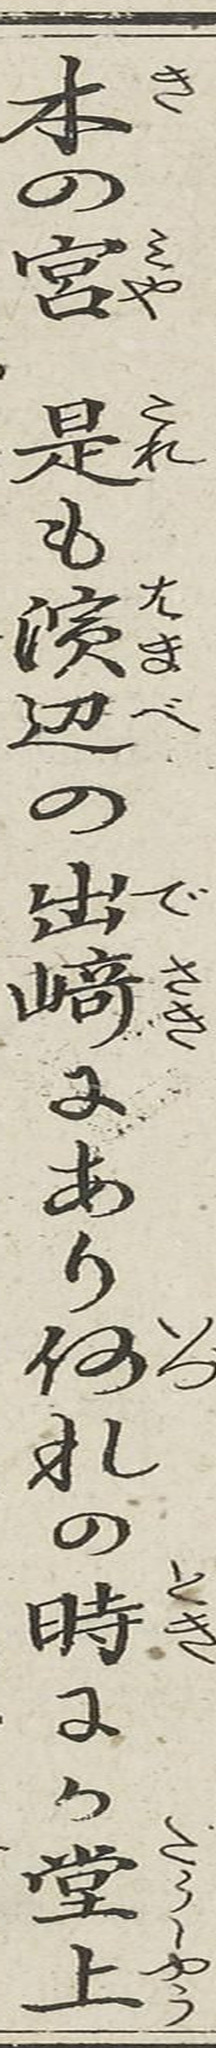木の宮是も浜辺の出崎にあり何れの時にか堂上
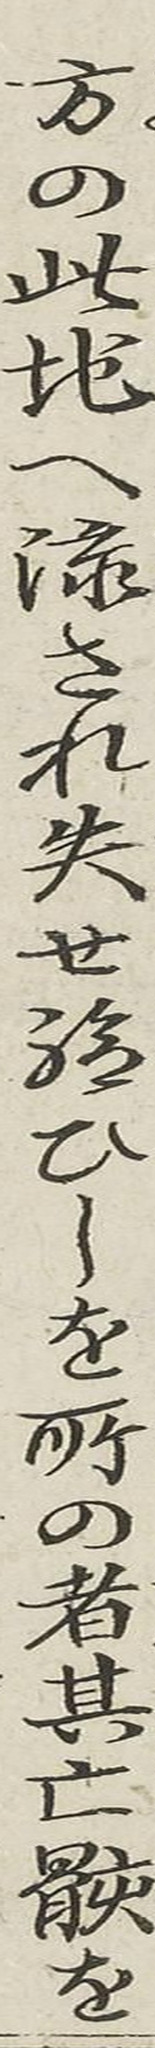方の此地へ流され失せ給ひしを所の者其亡骸を
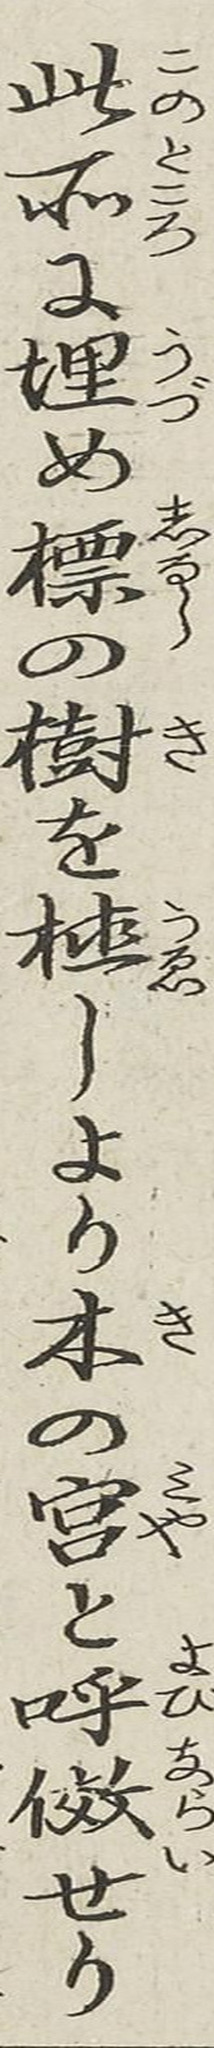此所に埋め標の樹を植しより木の宮と呼倣せり
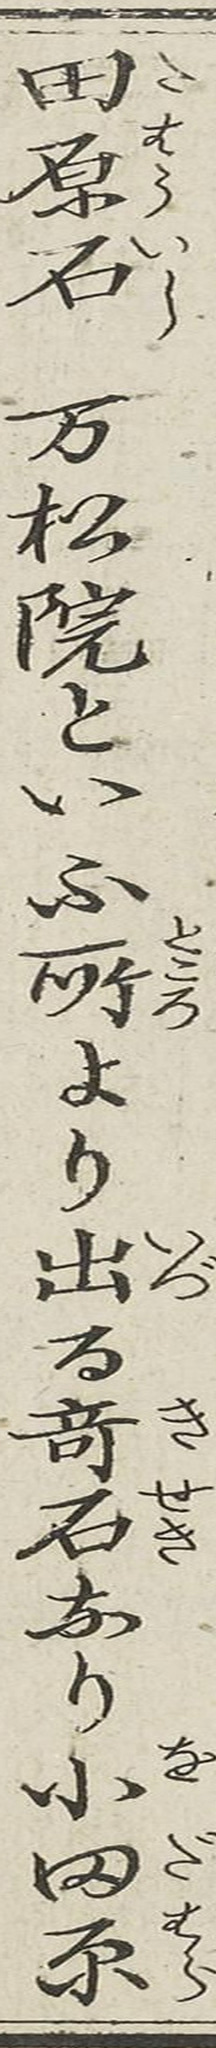田原石万松院といふ所より出る奇石なり小田原
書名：箱根温泉誌　全
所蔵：東京大学地震研究所図書室 Earthquake Research Institute Library, The University of Tokyo, JAPAN
